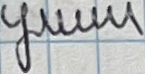улит
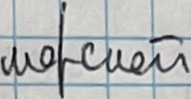морской
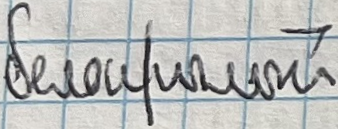белокрылый
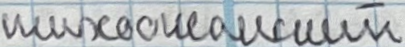тихоокеанский
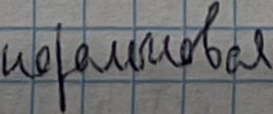корольковая
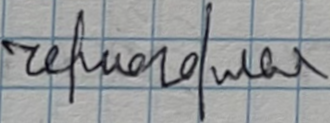черногорлая
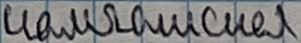камчатская
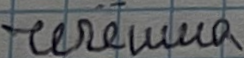чечётка
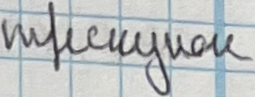трескунок
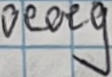осоед
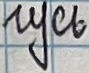гусь
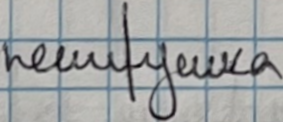пеструшка
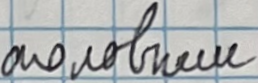ополовник
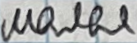малая
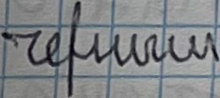черныш
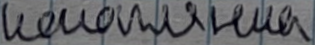коноплянка
